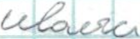иволга
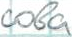сова
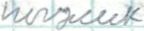пыжик
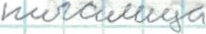пигалица
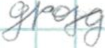дрозд
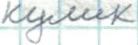кулик
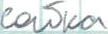сойка
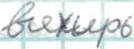вяхирь
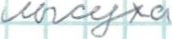лысуха
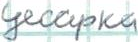цесарка
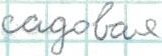садовая
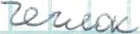чеглок
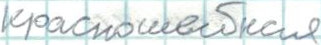красношейная
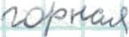горная
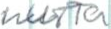питта
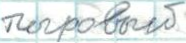тигровый
